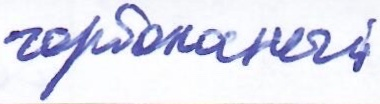горбоносный
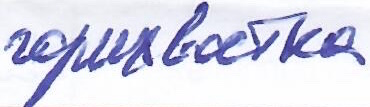горихвостка
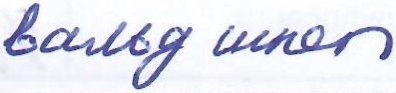вальд шнеп
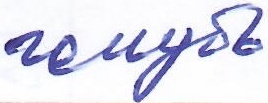голубь
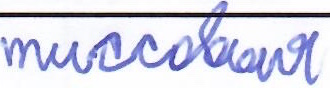тиссовая
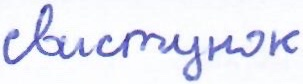свистунок
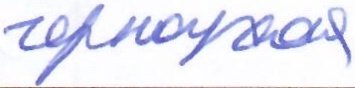черноухая
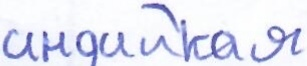индийкая
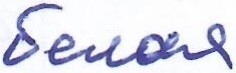белая
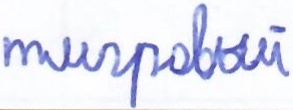тигровый
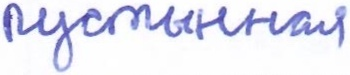пустынная
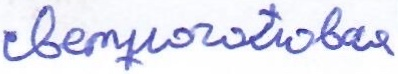светлоголовая
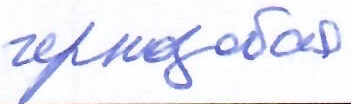чернозобая
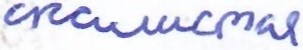скалистая
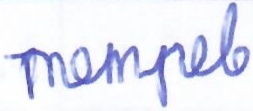тетрев
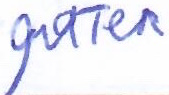дятел
